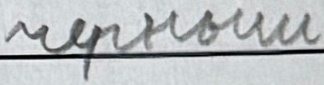черныш
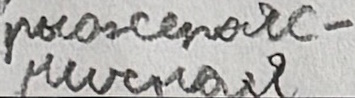рыжепояс-ничная
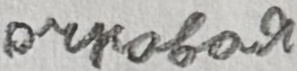очковая
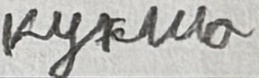кукша
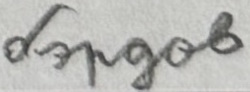бэрдов
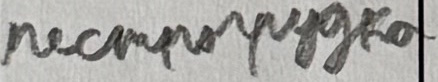пестрогрудка
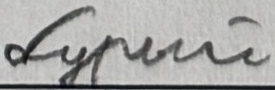бурый
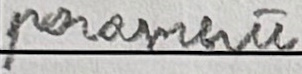рогатый
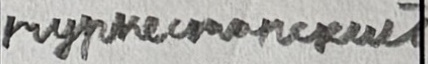туркестанский
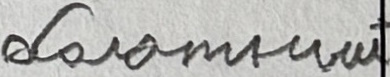болотный
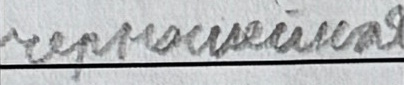черношейная
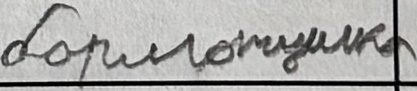бормотушка
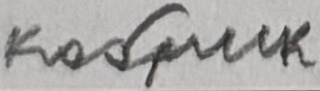кобрик
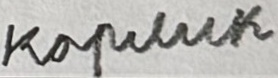карлик
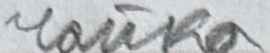чайка
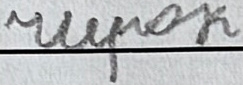чирок
